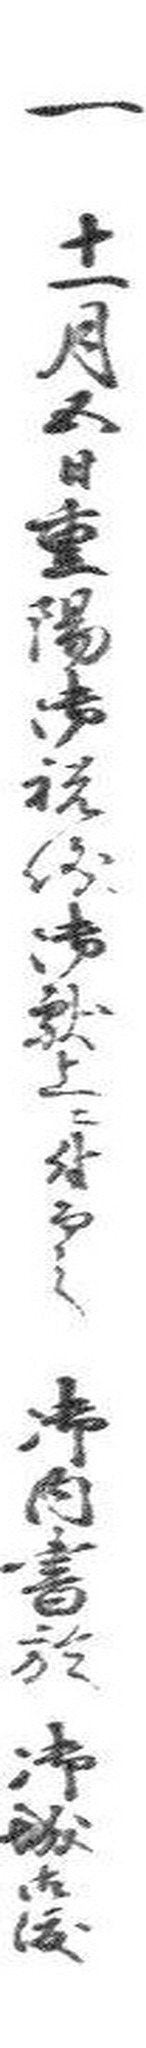一十一月五日重陽御祝儀御献上ニ付而之御内書於御城御渡
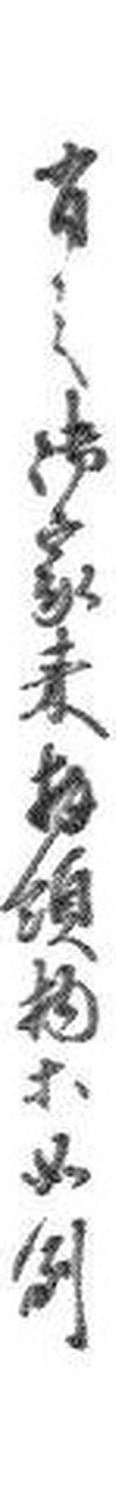有之御家来拝領物等如例
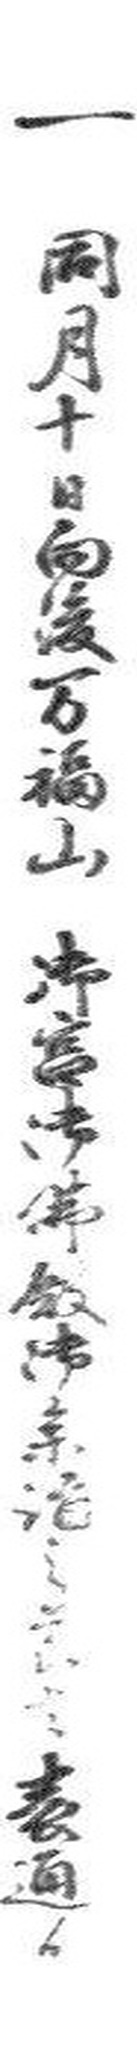一同月十日向後万福山御宮御仏殿御参詣之節者表通ゟ
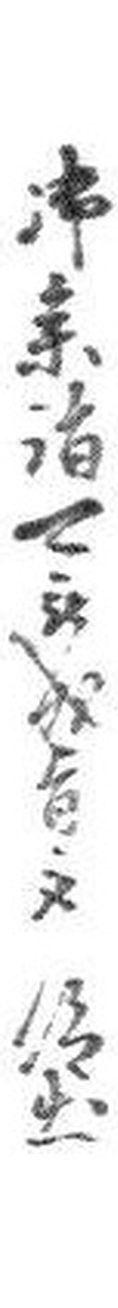御参詣可被成旨被仰出
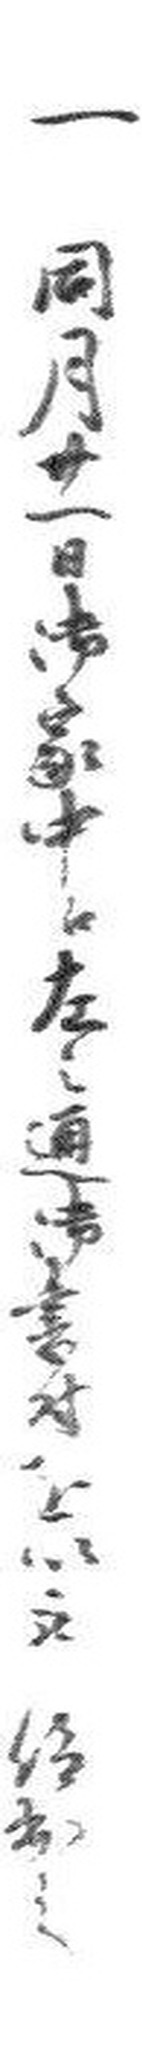一同月廿一日御家中江左之通御書付を以被仰出之
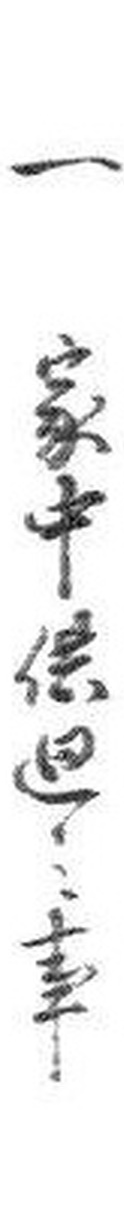一家中供廻之事
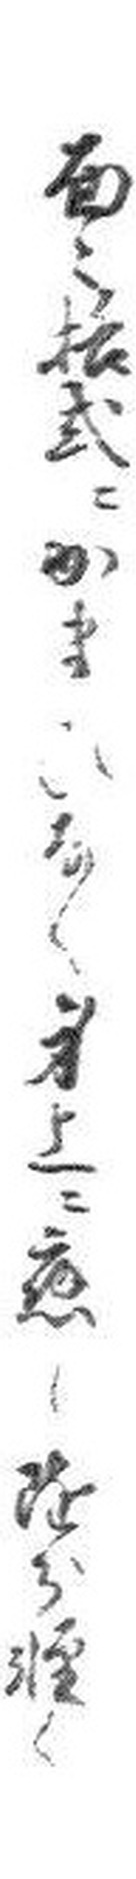面々格式ニかまひなく身上ニ応し随分軽く
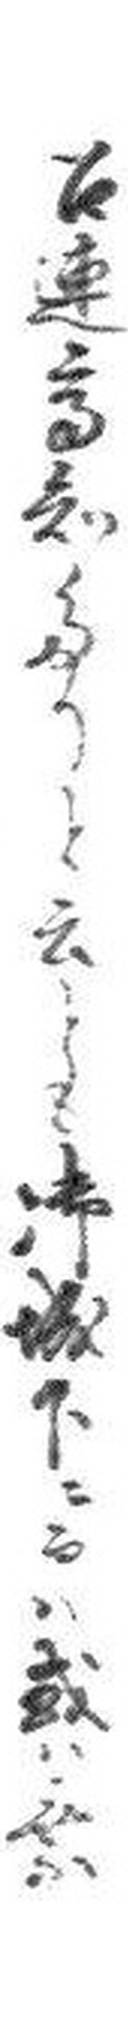召連高知たりと云とも御城下ニ而ハ或ハ乗

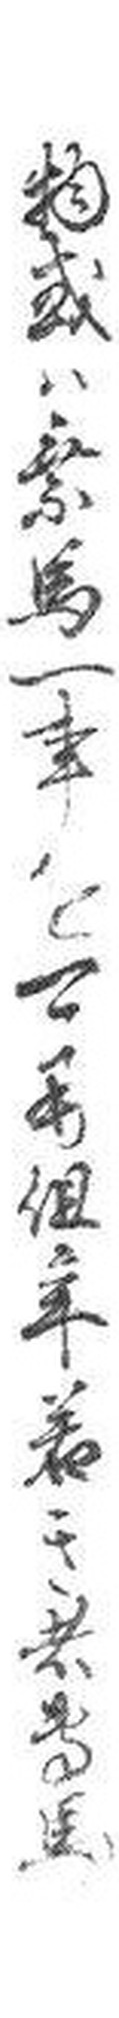ゝ物或ハ乗馬一事を可用但年若き者専馬
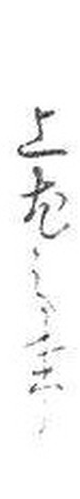上尤之事
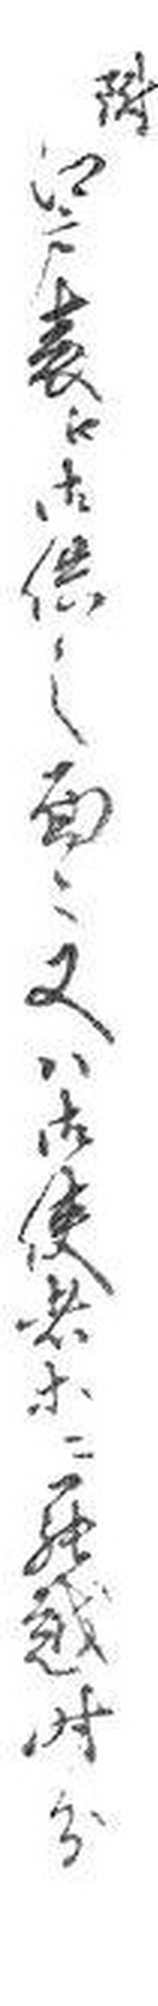江戸表江御供之面々又ハ御使者等ニ罷越時分
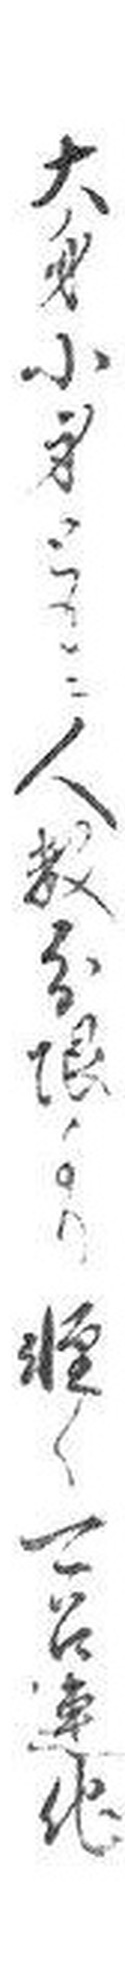大身小身ともに人数分限より軽く可召連他
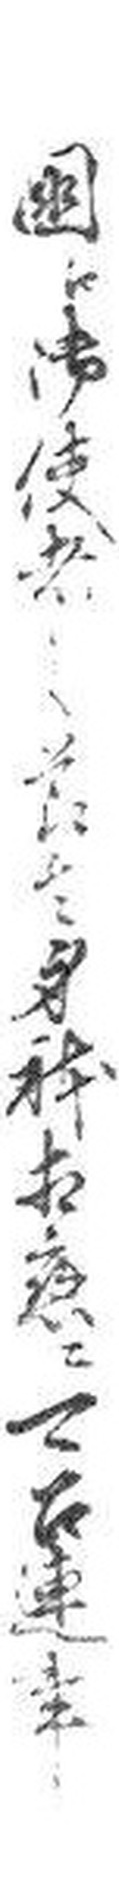国江御使者之節者身体相応ニ可召連事
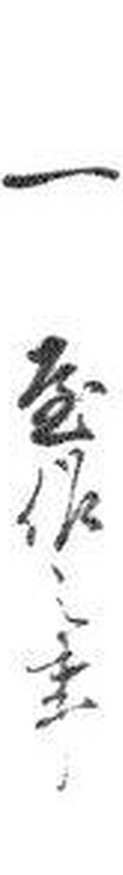一屋作之事
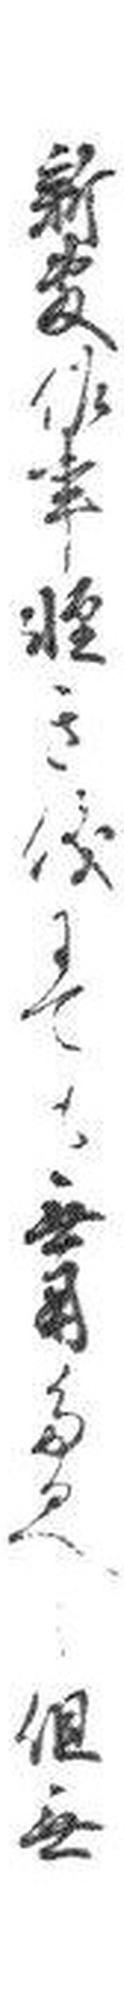新敷作事軽き儀にても無用たるへし但無
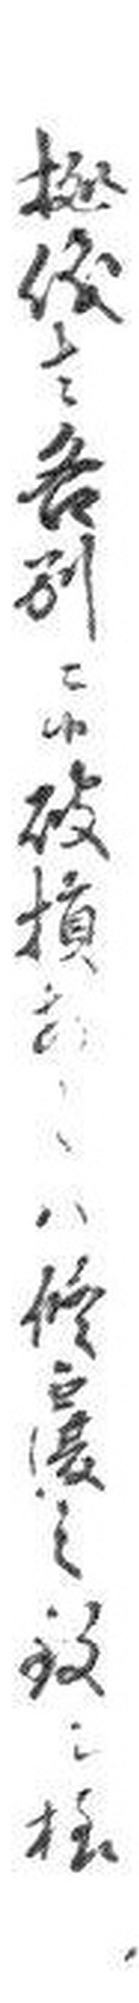拠儀者各別ニ候破損あらハ修覆之致シ様
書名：家譜 二十八 吉邦公 従宝永七年七月五日到正徳元年十二月
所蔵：福井県文書館 Fukui Prefectural Archives
